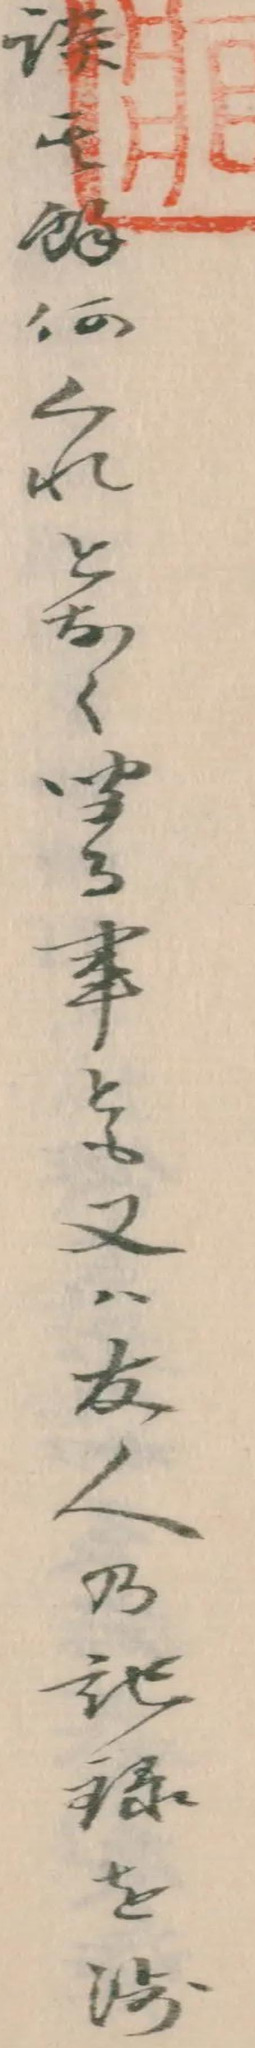談其余何くれとなく聞る事とも又は友人の記録を渉
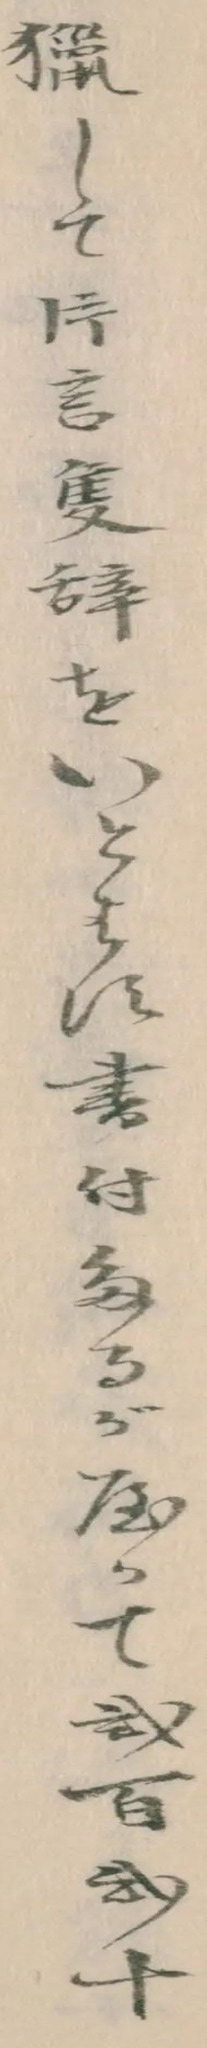猟して片言隻辞をいとはす書付たるがやかて弐百弐十
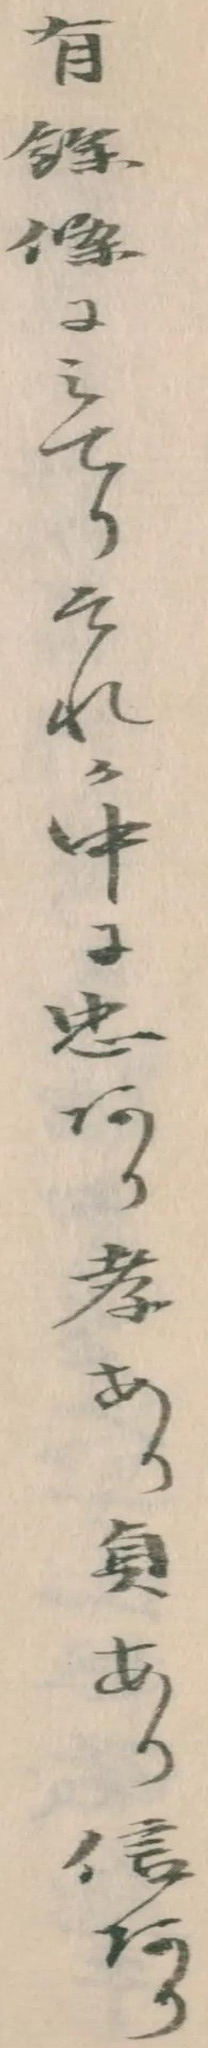有余條にみてりそれか中に忠あり孝あり貞あり信あり
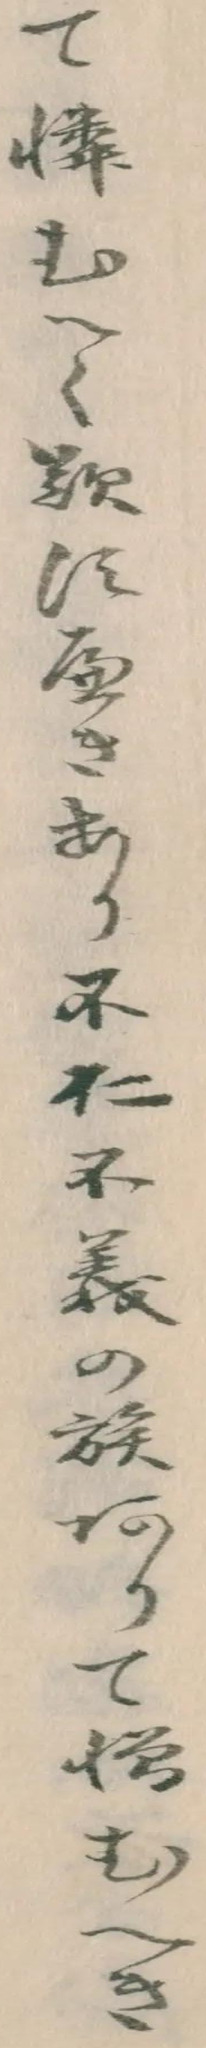て憐むへく歎すへきあり不仁不義の族ありて憎むへき
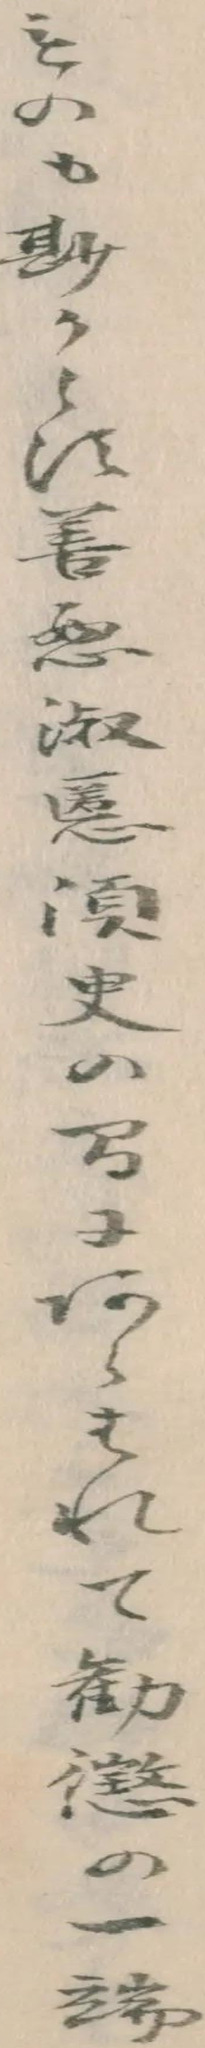ものも尠からす善悪淑慝須臾の間にあらはれて勧懲の一端
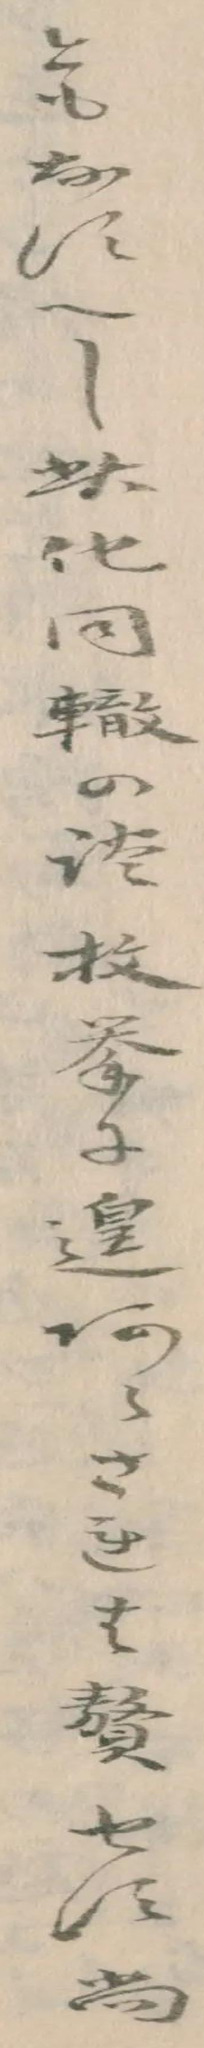ともなすへし此他同轍の談枚挙に遑あらされは贅せす尚
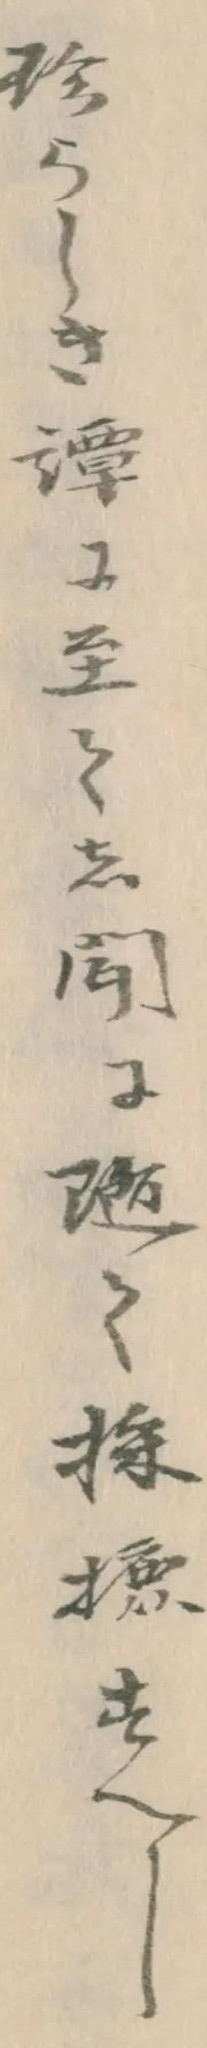珍らしき譚に至ては聞に随て採摭すへし

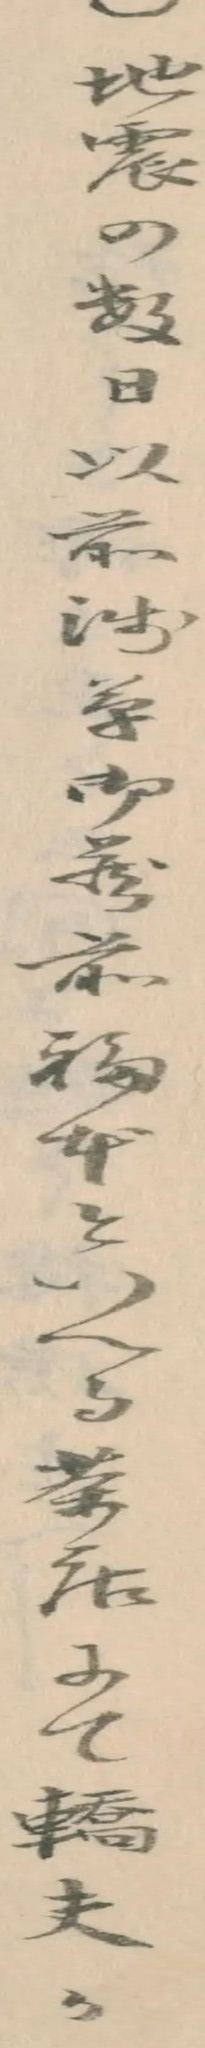〇地震の数日以前浅草御蔵前福本といへる茶店にて轎夫か
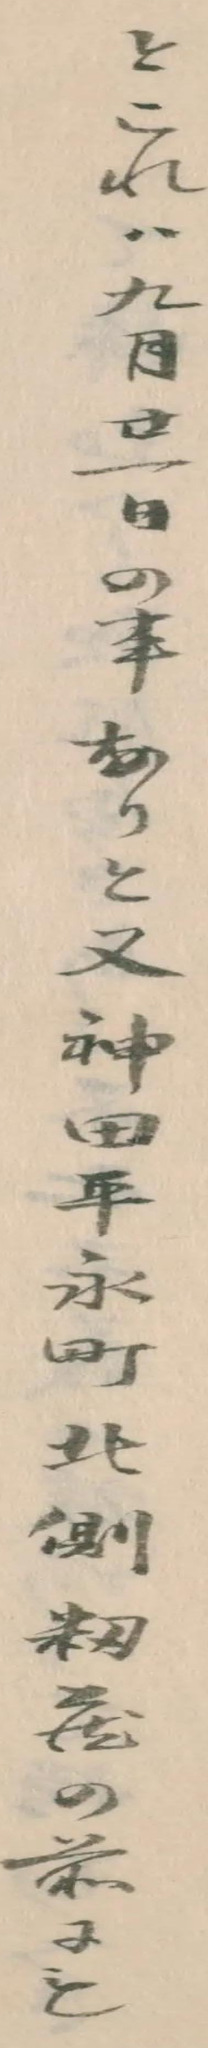とこれは九月廿一日の事なりと又神田平永町北側籾蔵の前にも
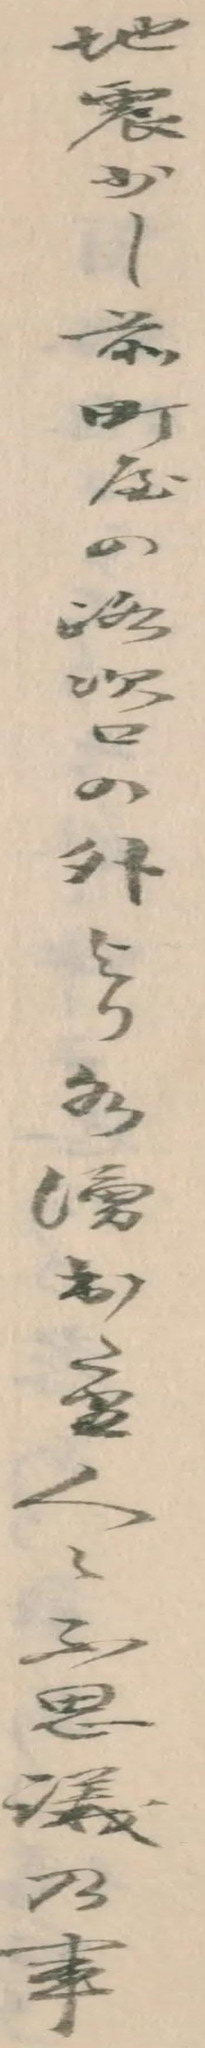地震少し前町屋の路次口の外より水湧出たり人々不思議の事
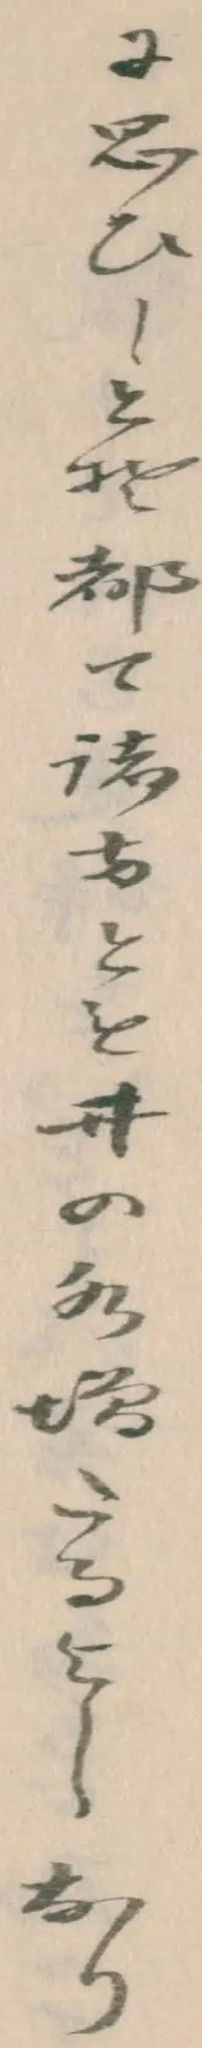に思ひしとそ都て諸方とも井の水増たるよしなり
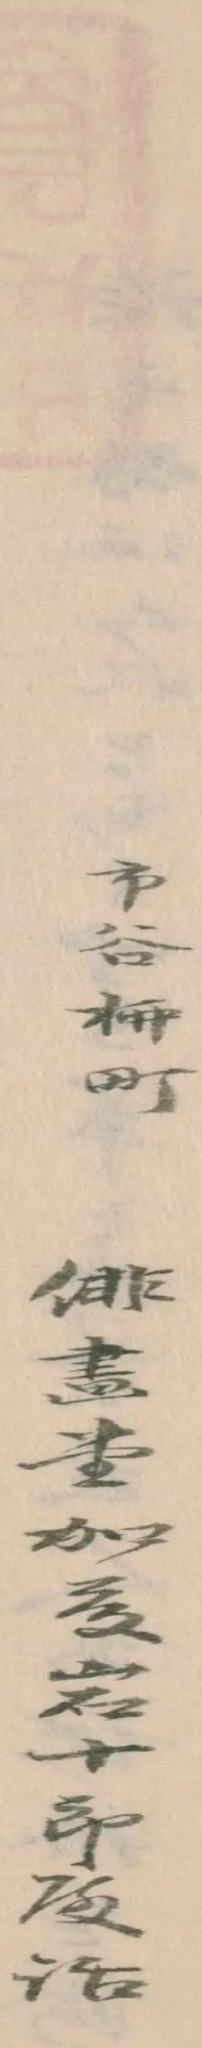市谷柳町俳画堂加藤岩十郎殿話
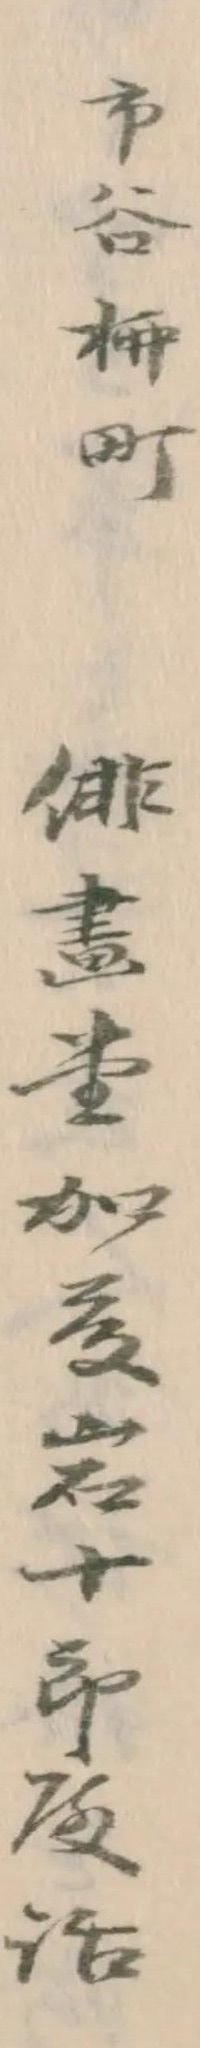市谷柳町俳画堂加藤岩十郎殿話
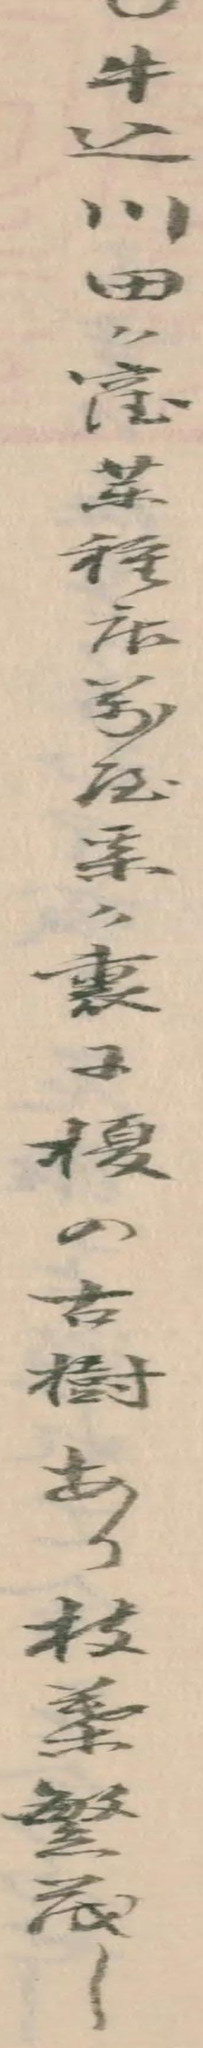〇牛込川田〃窪菜種店万屋某か裏に榎の古樹あり枝葉繁茂し
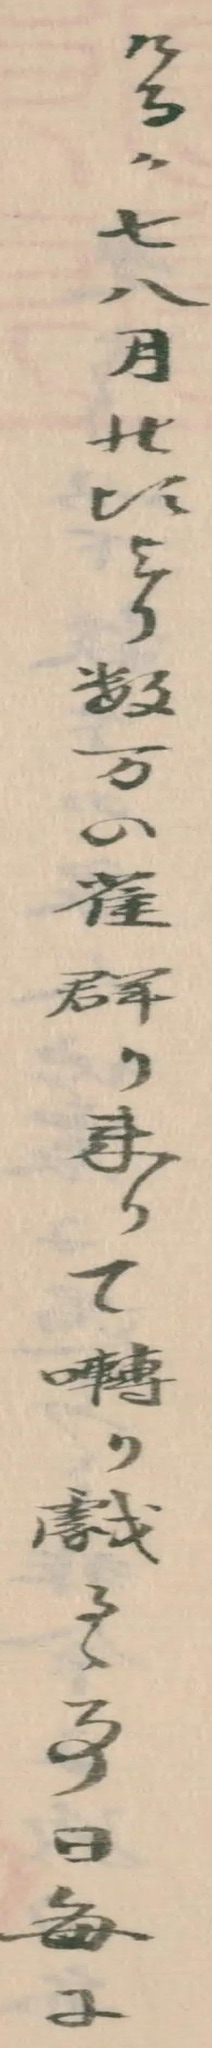けるか七八月の頃より数万の雀群り来りて囀り戯るゝ事日毎に
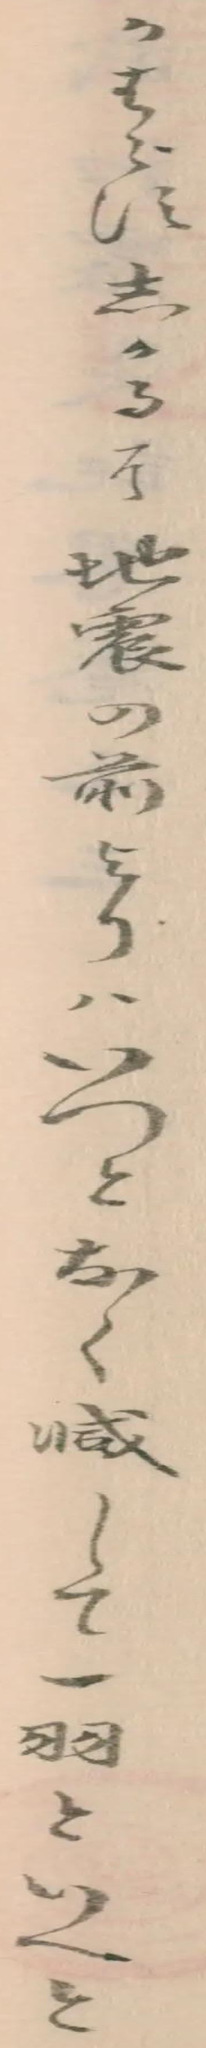かはらすしかるに地震の前よりはいつとなく減して一羽といへと
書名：地災撮要. 巻7-9(地震之部)
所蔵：国立国会図書館 National Diet Library, JAPAN
